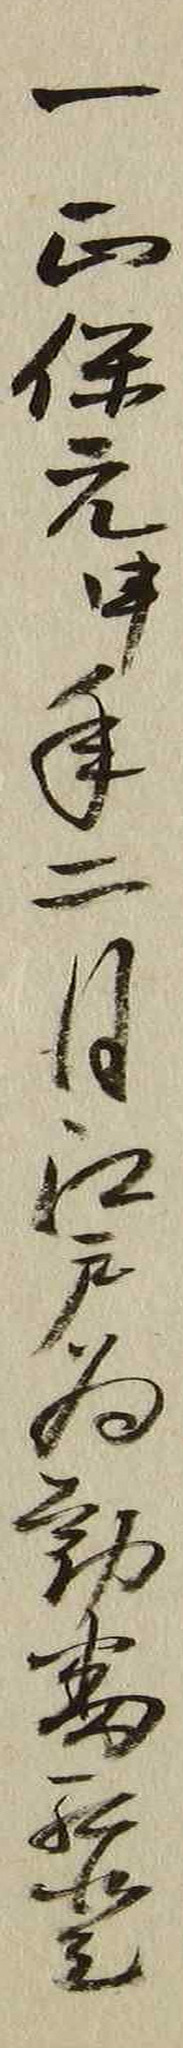一正保元申年二月江戸為勤番罷登
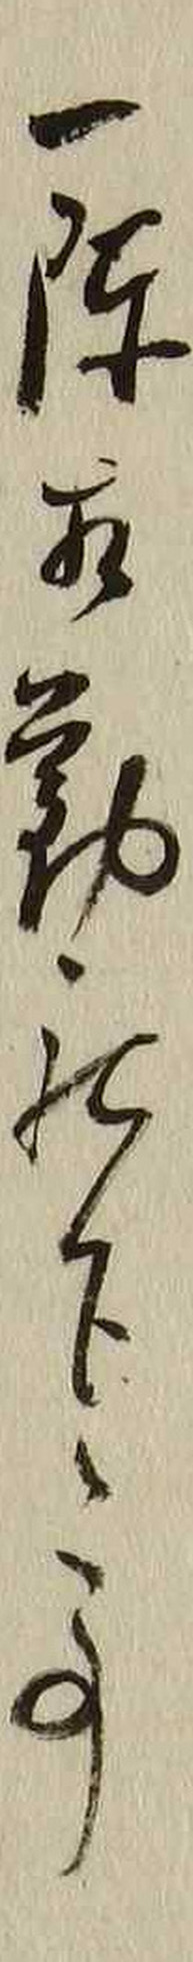一陣相勤罷下候事
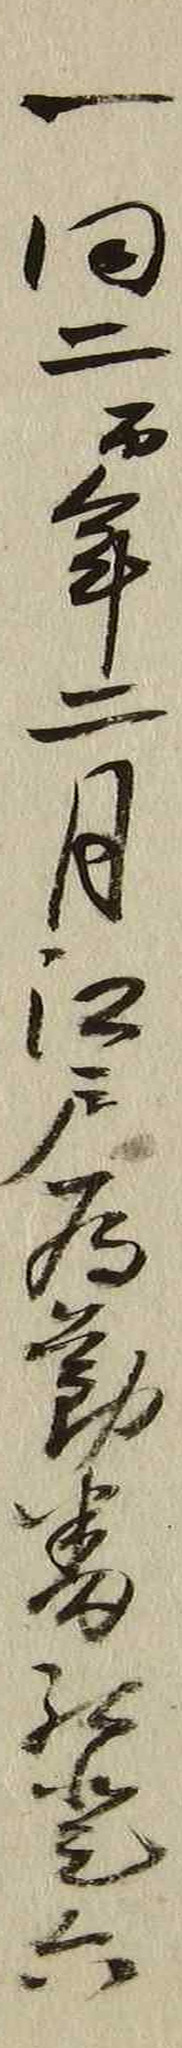一同二酉年二月江戸為勤番罷登六
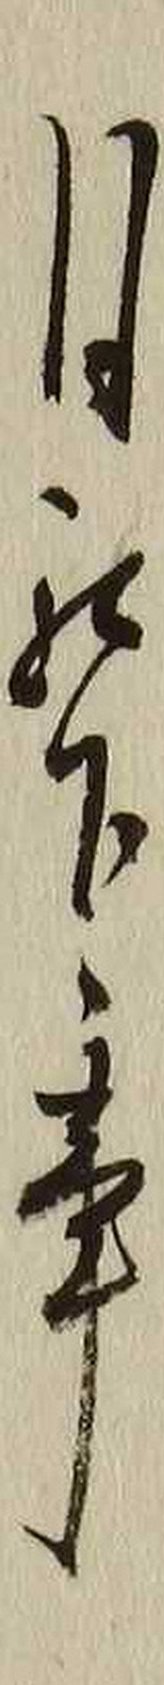月罷下候事
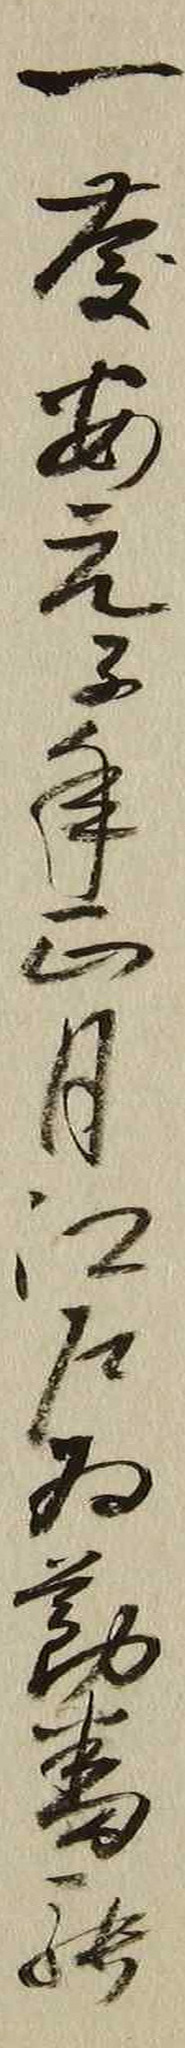一慶安元子年正月江戸為勤番罷
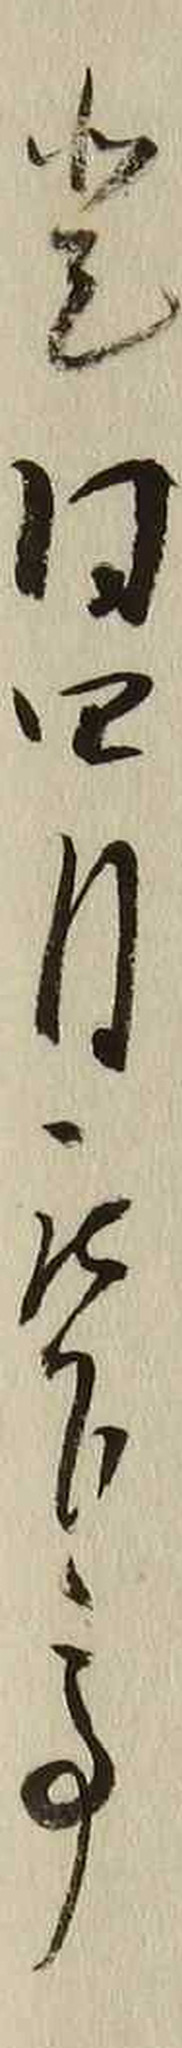登同四月罷下候事
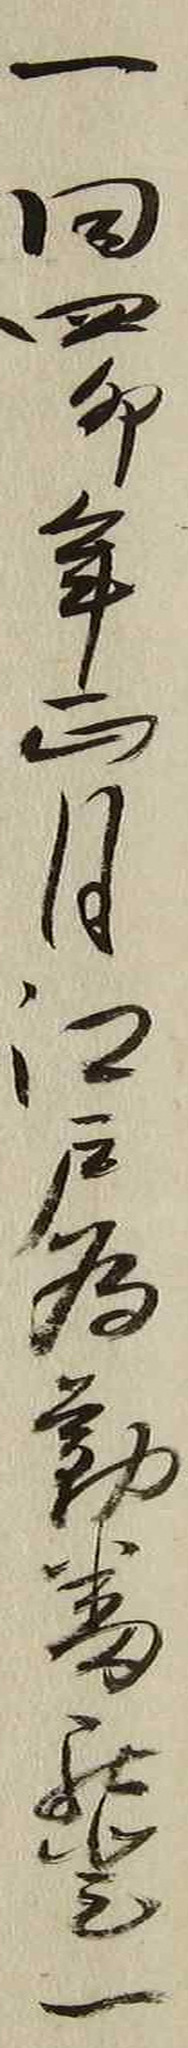一同四卯年正月江戸為勤番罷登一
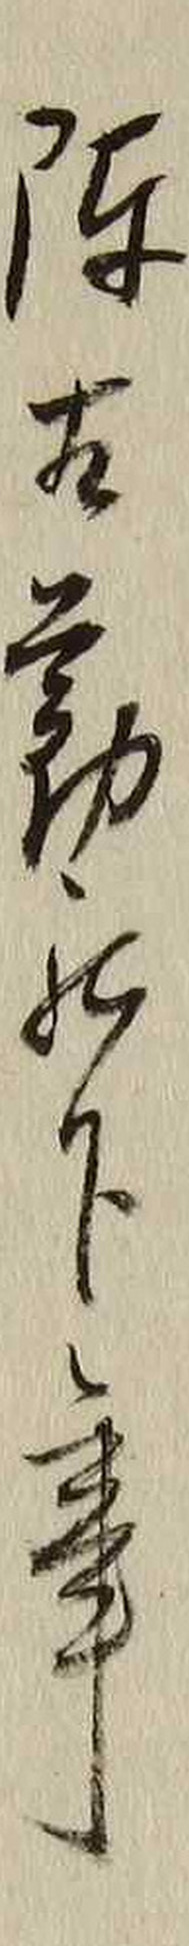陣相勤罷下候事
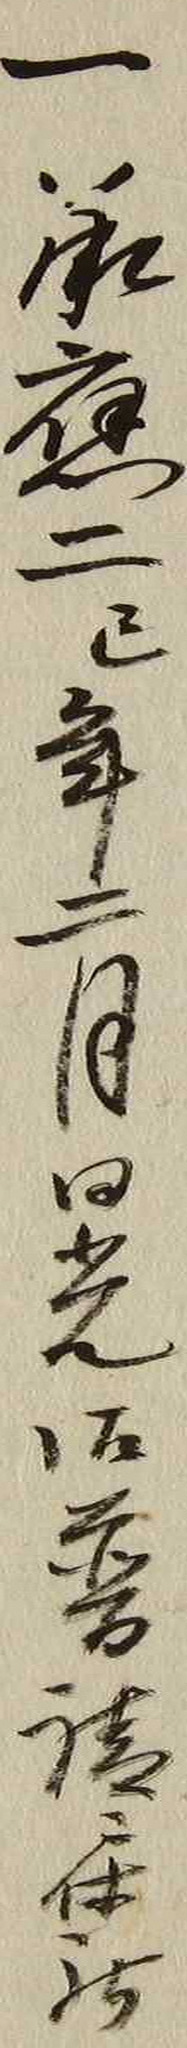一承応二巳年二月日光御普請ニ付罷
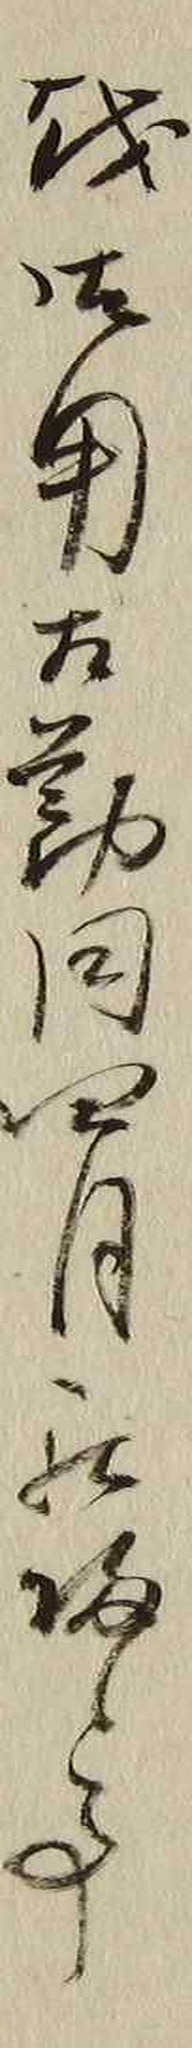越御用相勤同四月罷帰候事
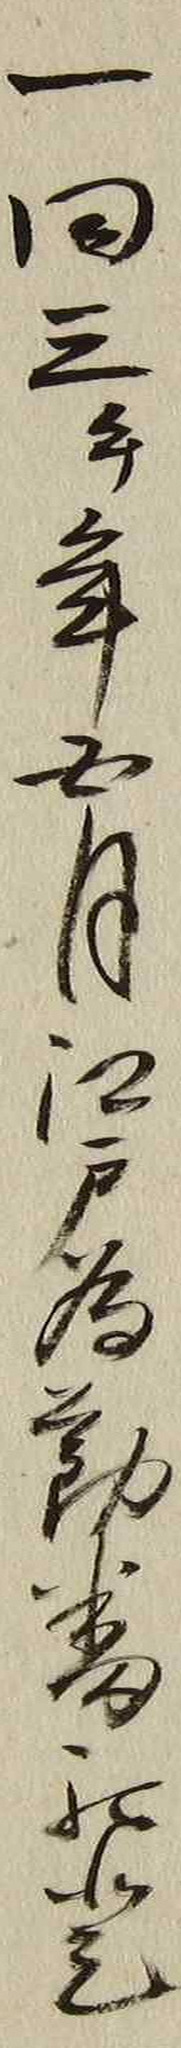一同三午年五月江戸為勤番罷登
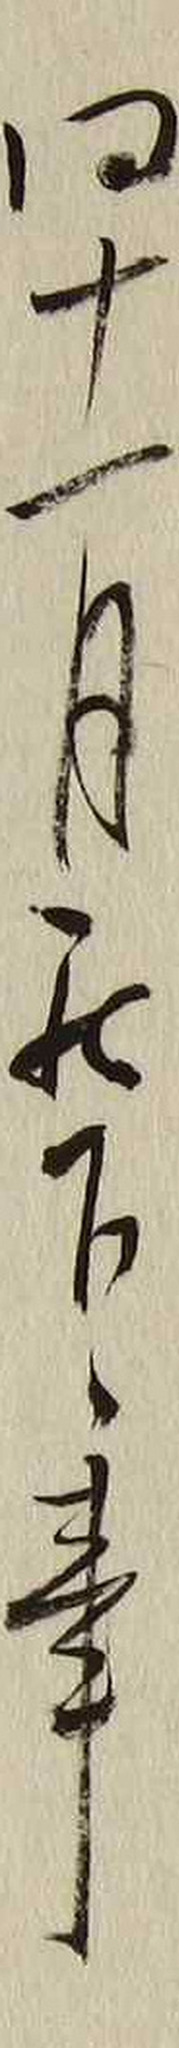同十一月罷下候事
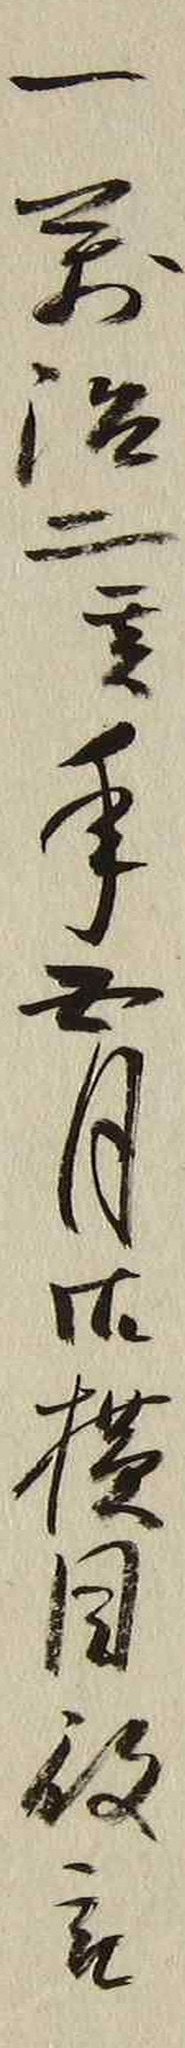一万治二亥年五月御横目役被
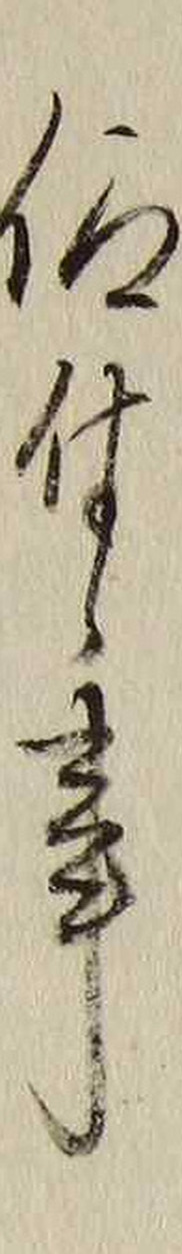仰付候事
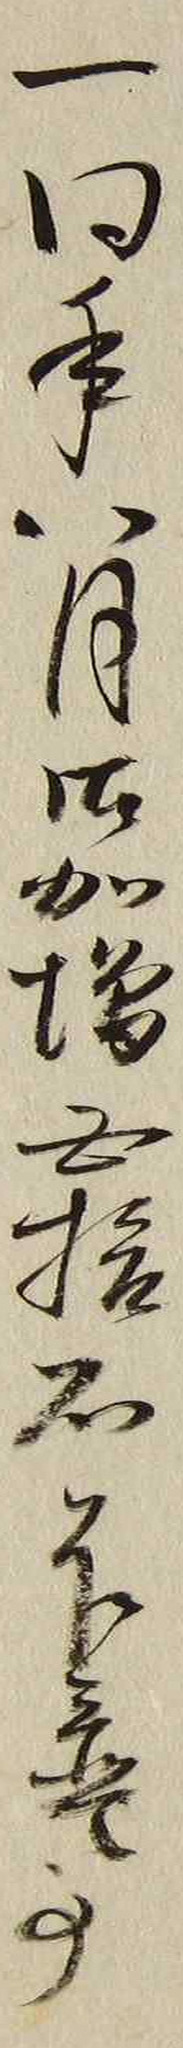一同年八月御加増五拾石被下置候事
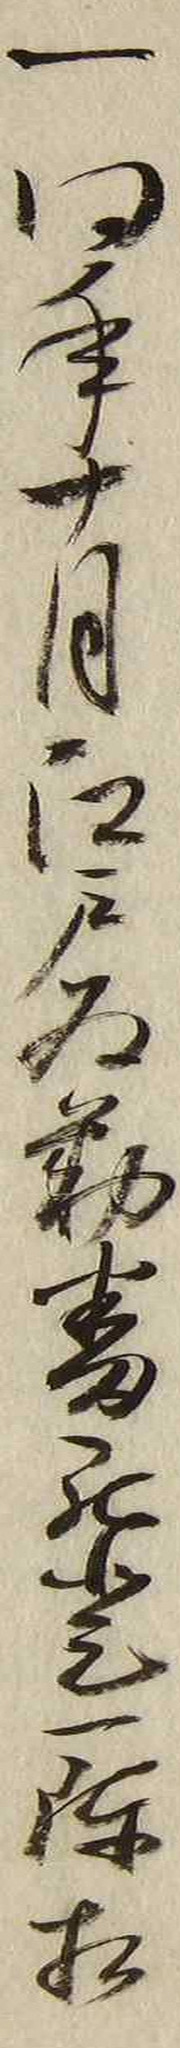一同年十月江戸為勤番罷登一陣相
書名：諸士系譜　巻之352　す之部2
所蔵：会津若松市立会津図書館
